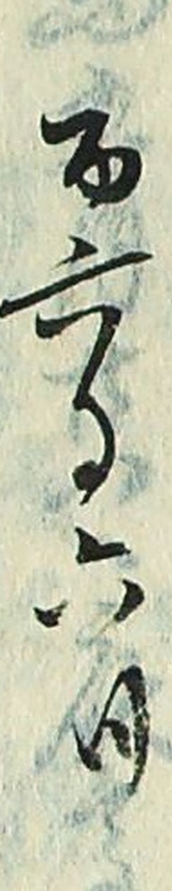酉六月六日
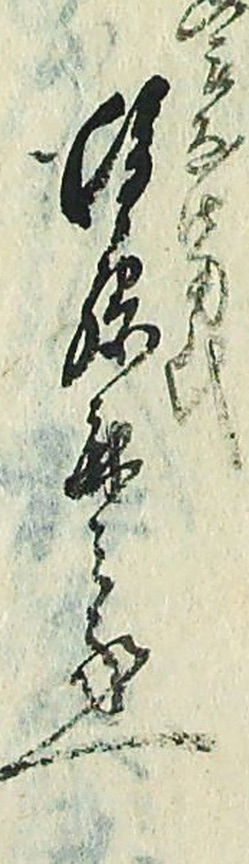後藤麻之丞
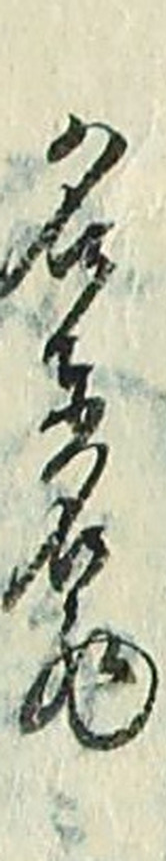名東名西
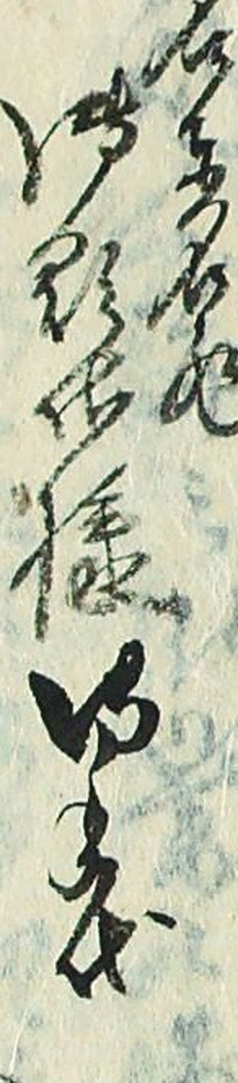御郡代様御手代
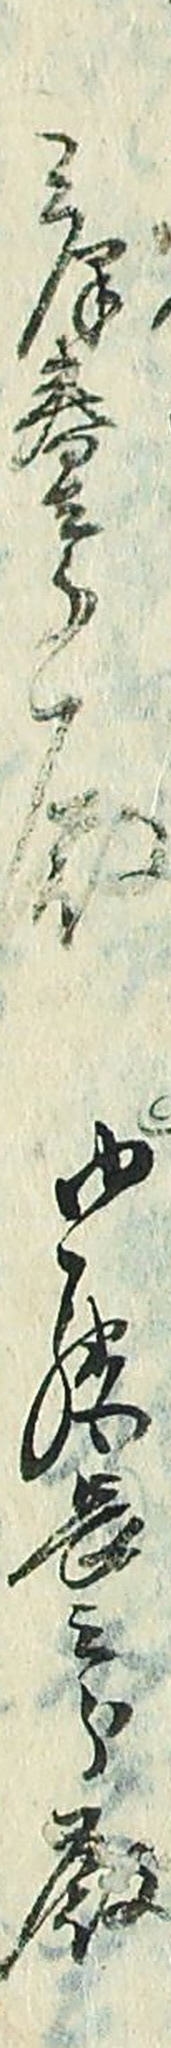三沢春太郎殿内藤長三郎殿
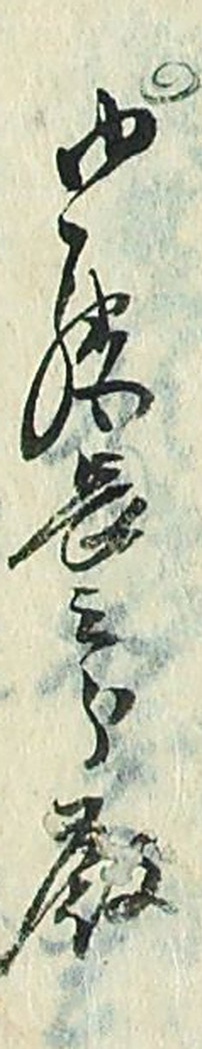内藤長三郎殿
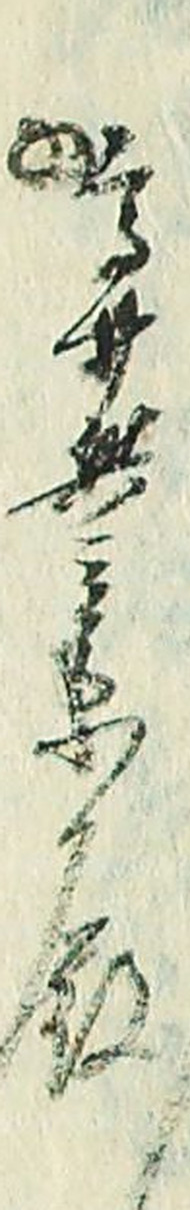高井与三兵衛殿
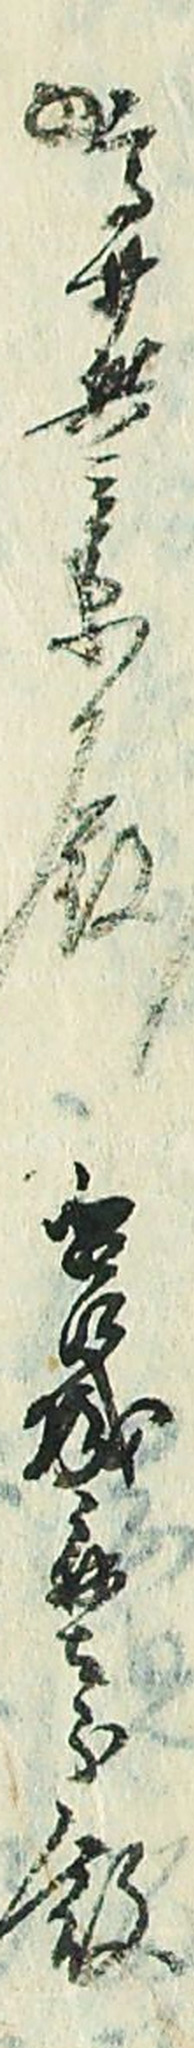高井与三兵衛殿宮城麻太郎殿
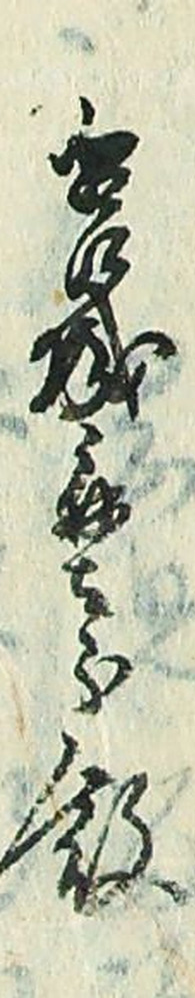宮城麻太郎殿

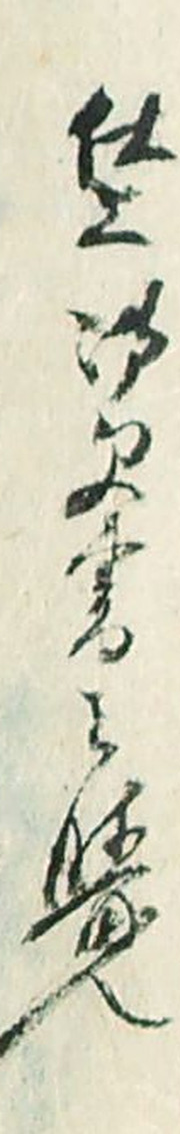仕上御受書之覚
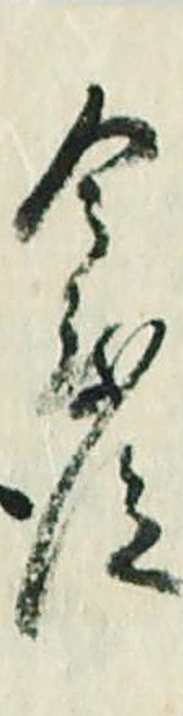今度従
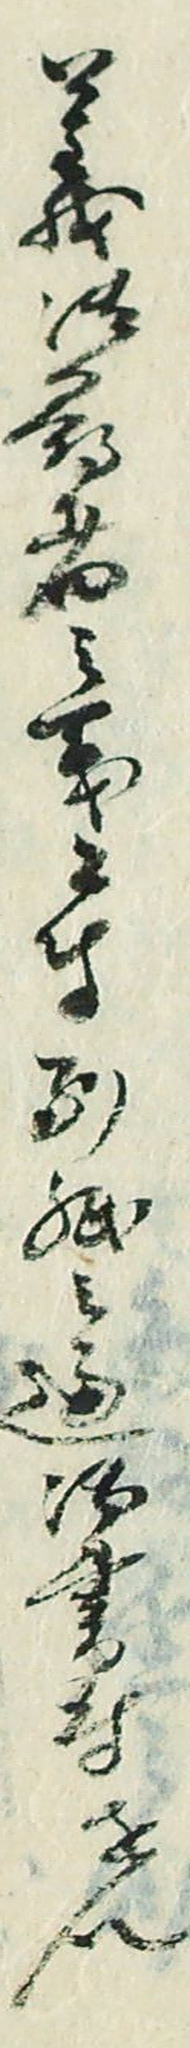公義御尋者之義に付別紙之通御書付を以
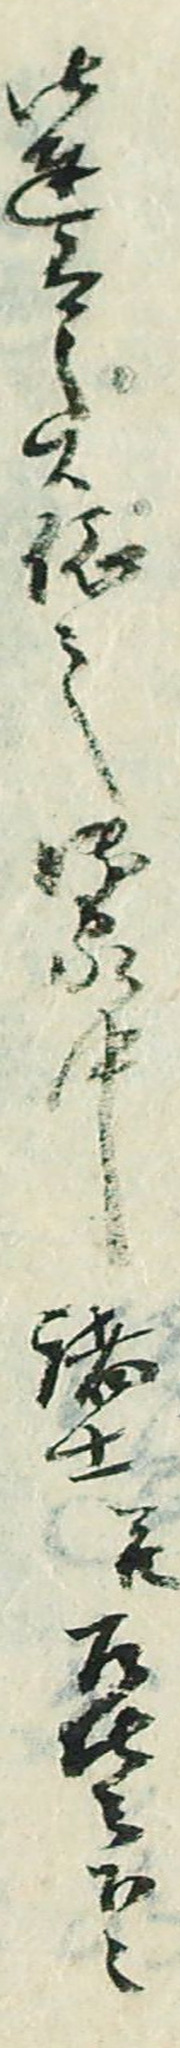御達有之候依之御家中諸士幷召仕之下々
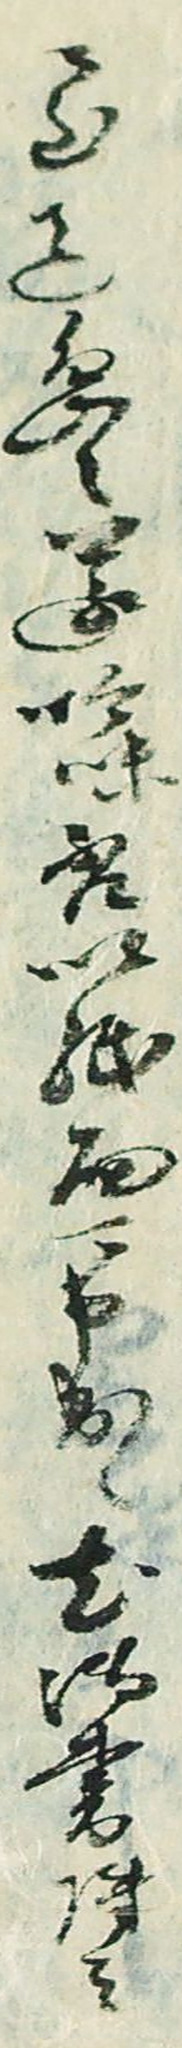に至迄急々遂吟味否以紙面可申出候尤御書付之
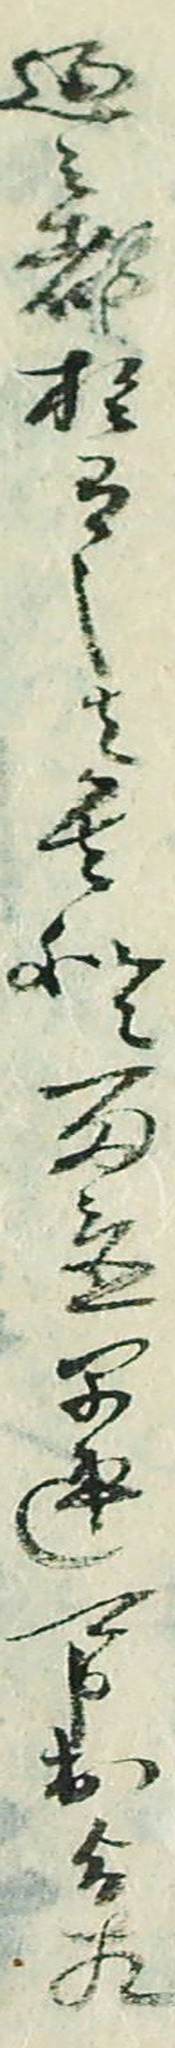通之者於有之は其処に留置早速可申出旨相
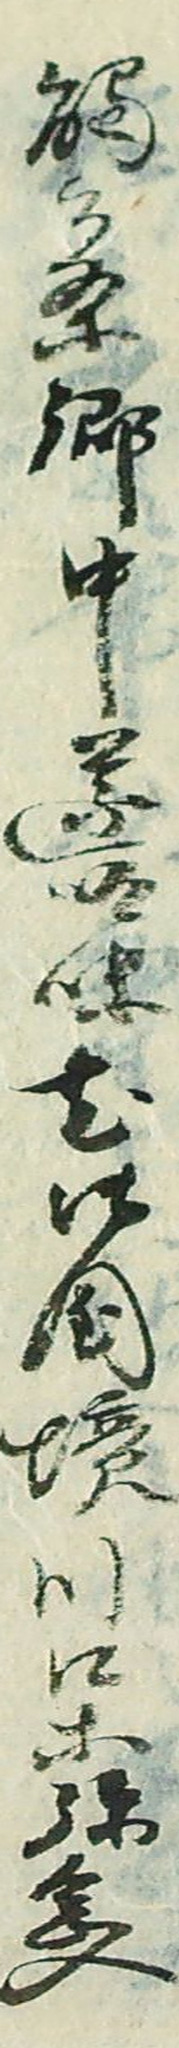触候条郷中遂吟味尤御国境川口等弥念入
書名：諸御用御□受書控
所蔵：鳴門教育大学 Naruto University of Education
